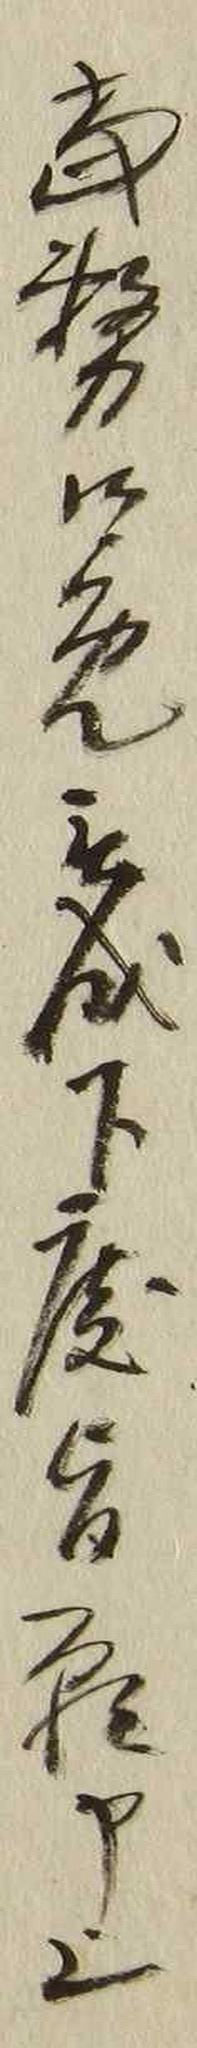当務御免被成下度旨願申上
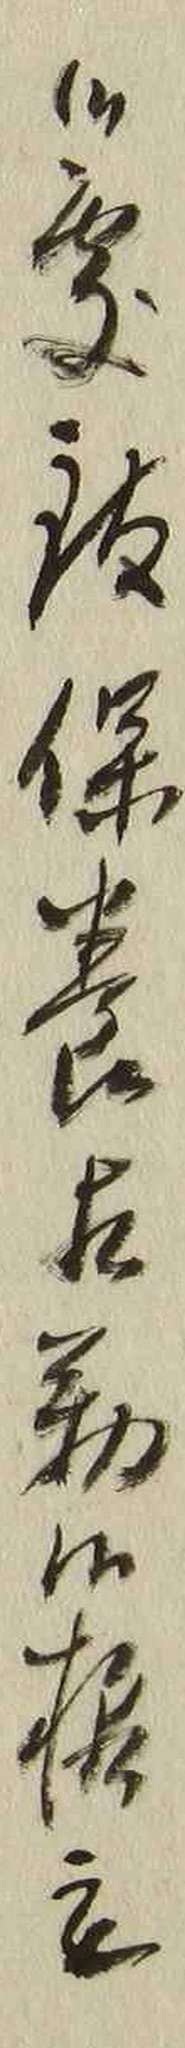候処致保養相勤候様被
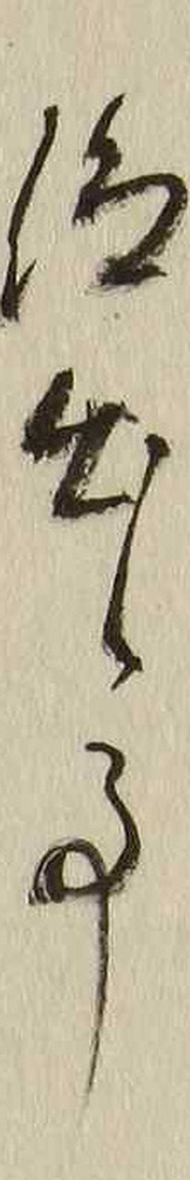仰出候事
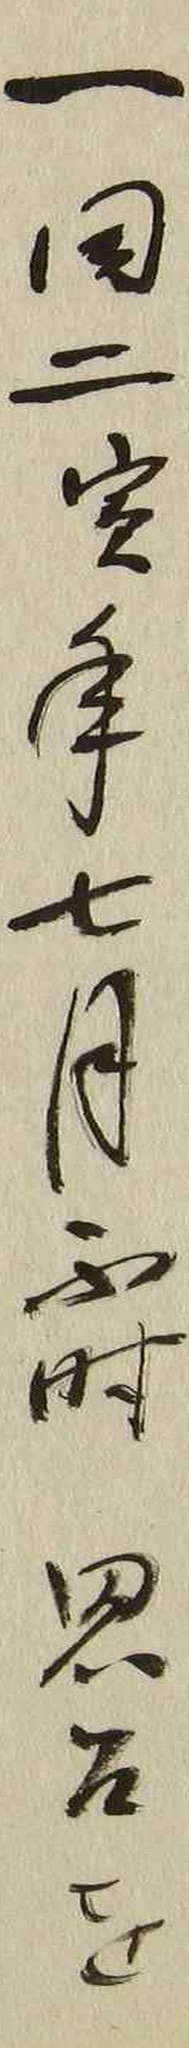一同二寅年七月不時思召を
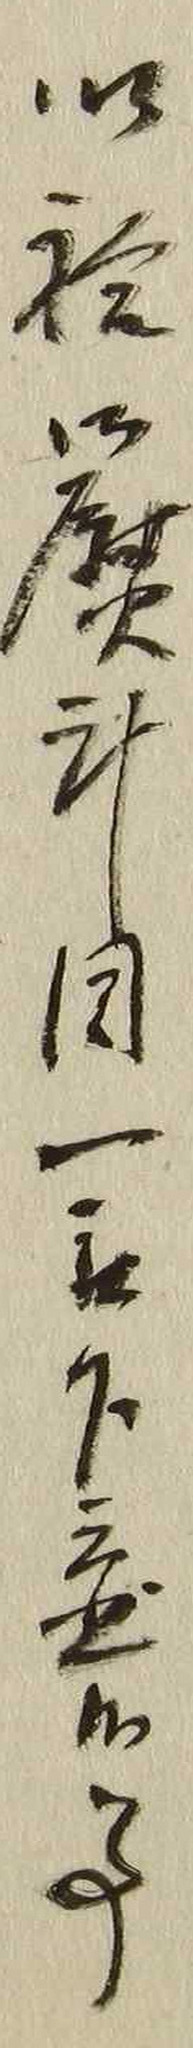以袷御熨斗目一被下置候事
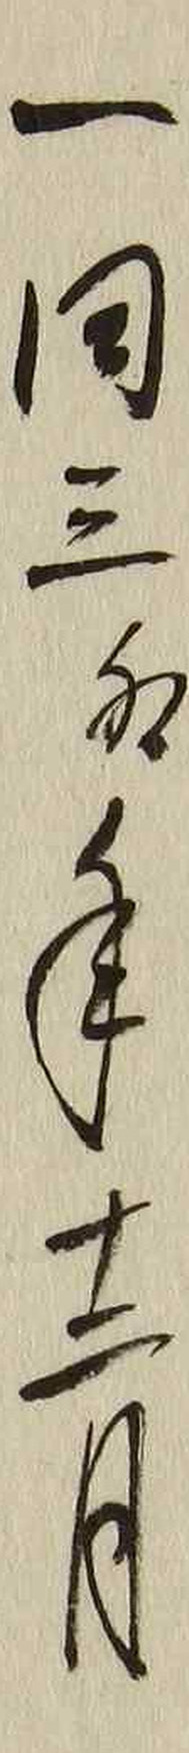一同三卯年十二月
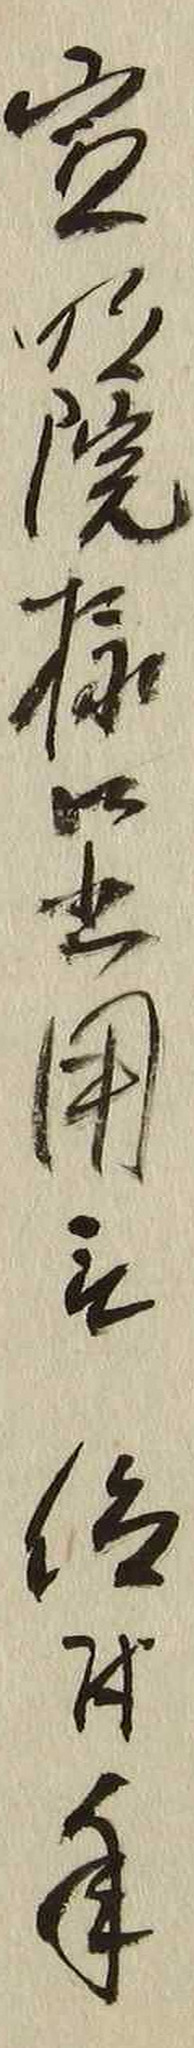宣明院様御書用被仰付年
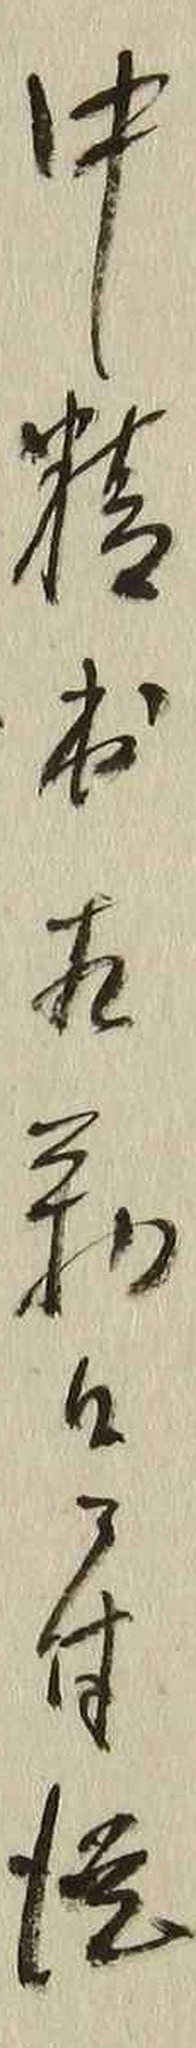中精出相勤候ニ付従
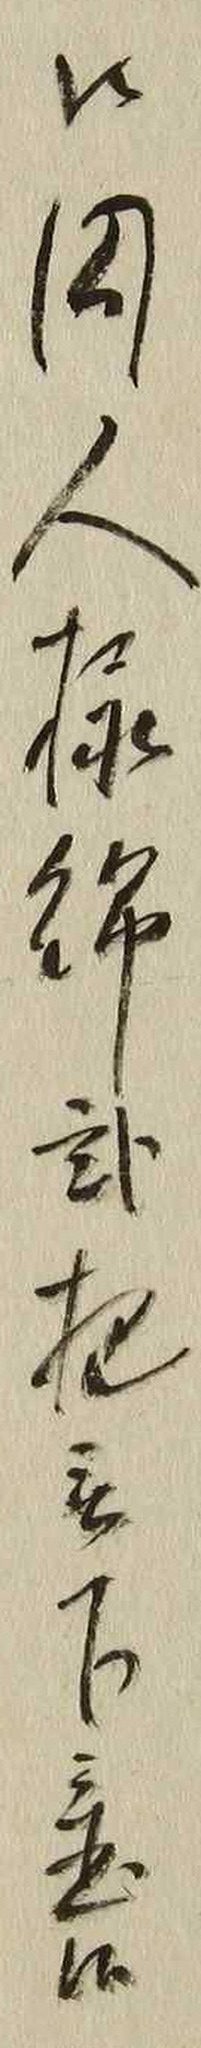御同人様綿弐把被下置候
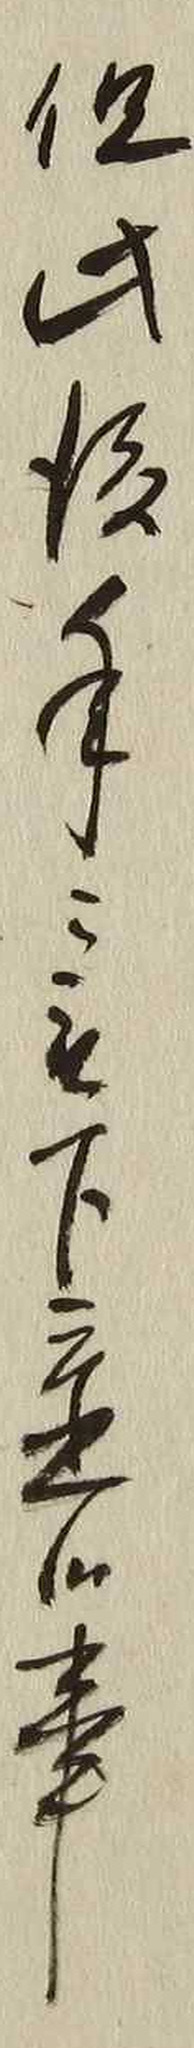但此後年々被下置候事
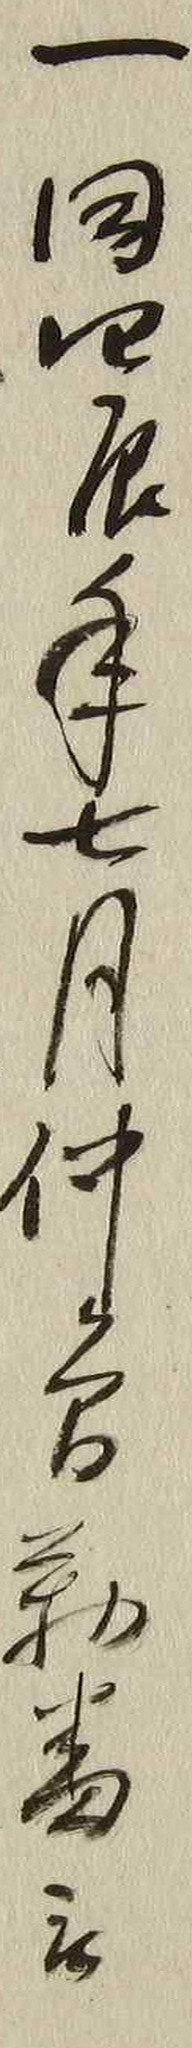一同四辰年七月仲ケ間勤番被
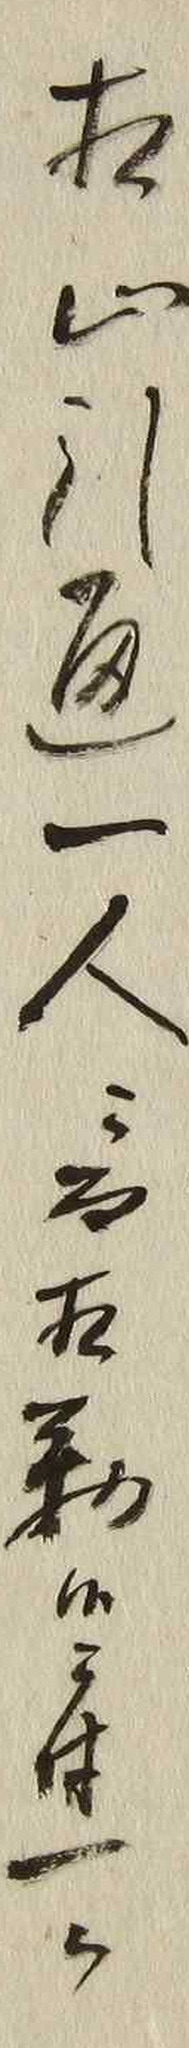相止引通一人ニ而相勤候ニ付一ケ
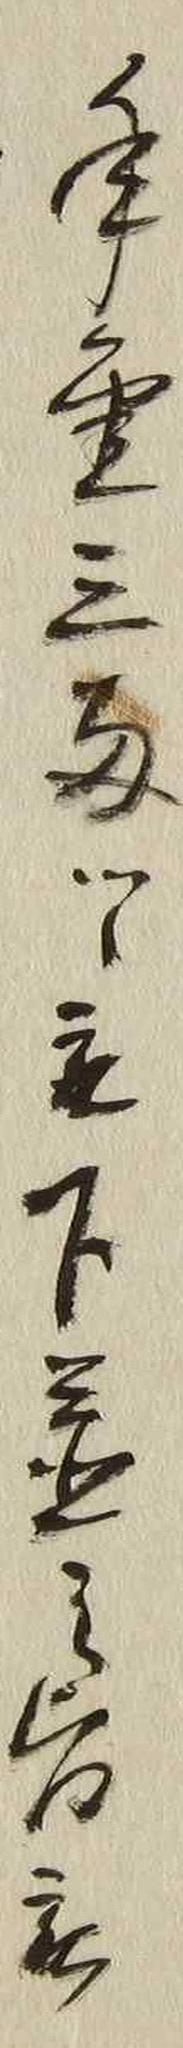年金三両ツヽ被下置之旨被
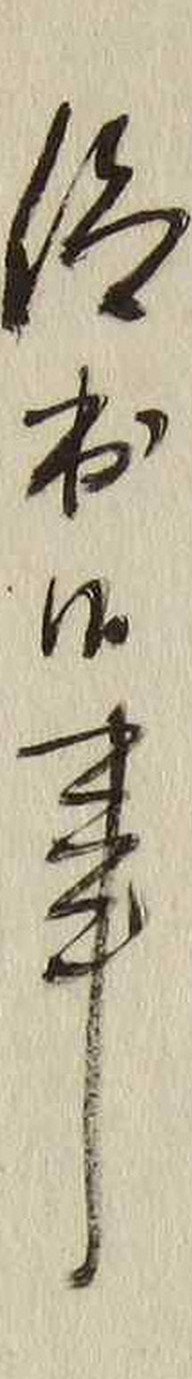仰出候事
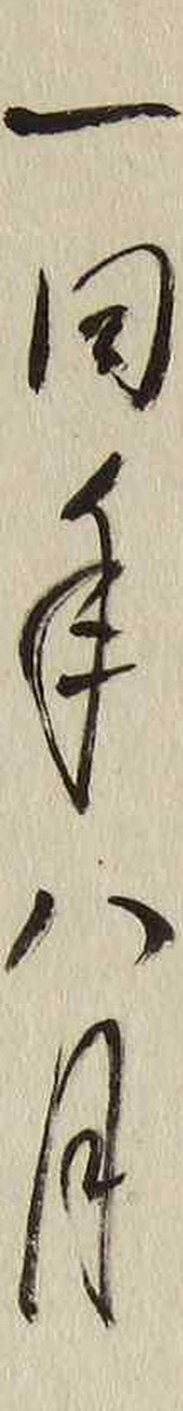一同年八月
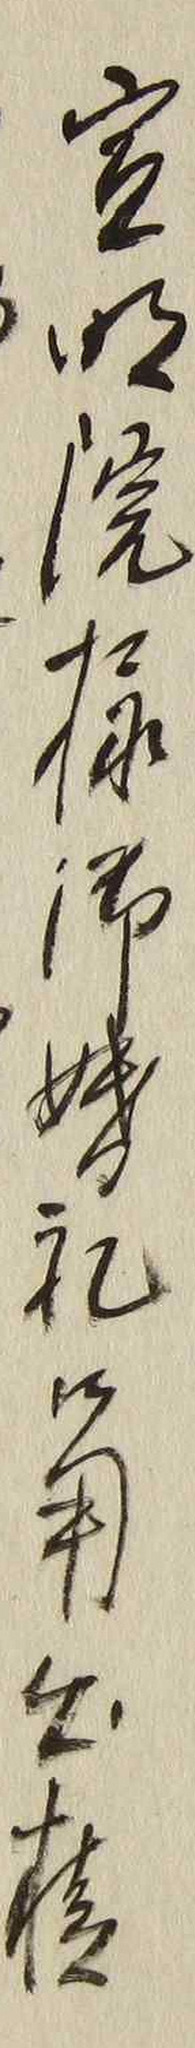宣明院様御婚礼御用出精
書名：諸士系譜　巻之359　す之部9
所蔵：会津若松市立会津図書館
